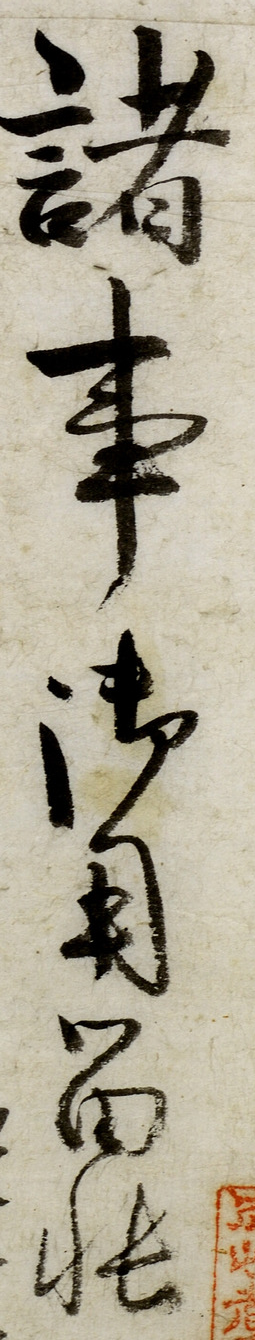諸事御用留帳
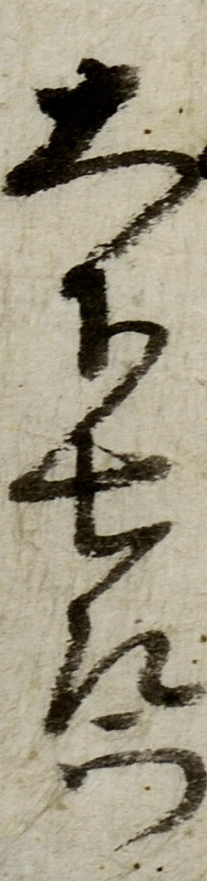大下七左衛門
